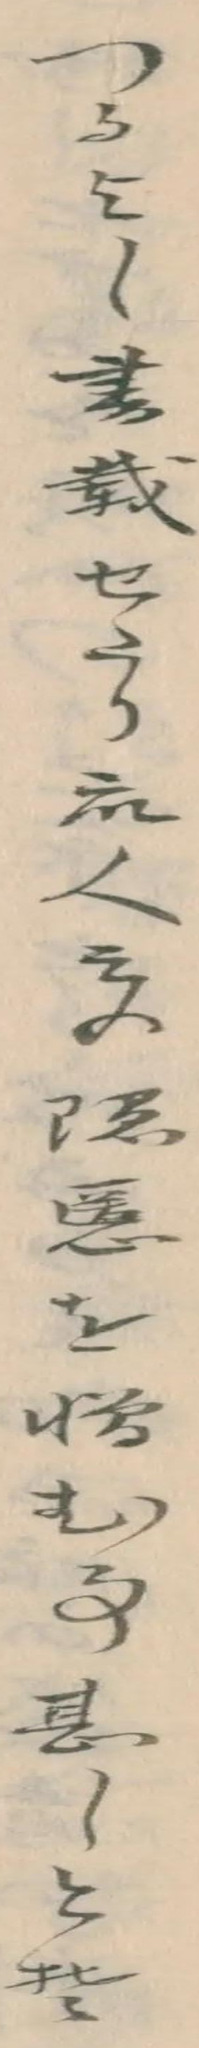つるよし書載せたり衆人その隠慝を憎む事甚しとそ
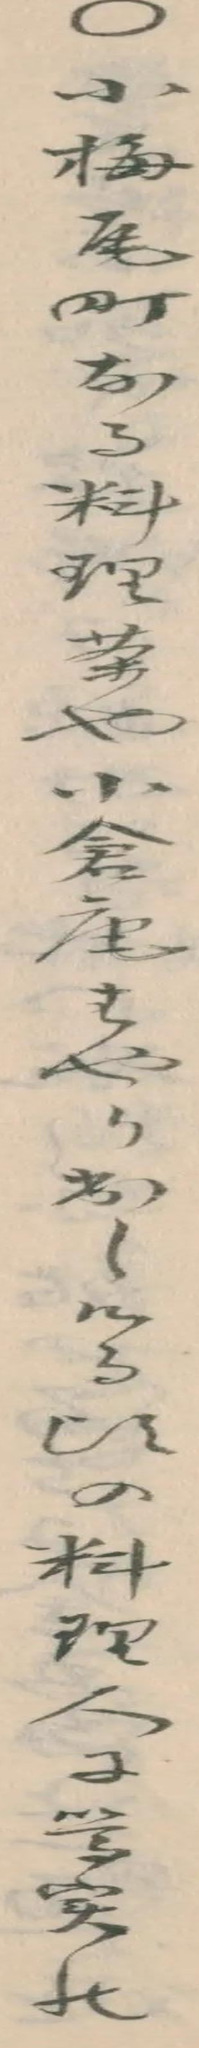〇小梅瓦町なる料理茶や小倉庵はやり出しける頃の料理人に篤実の
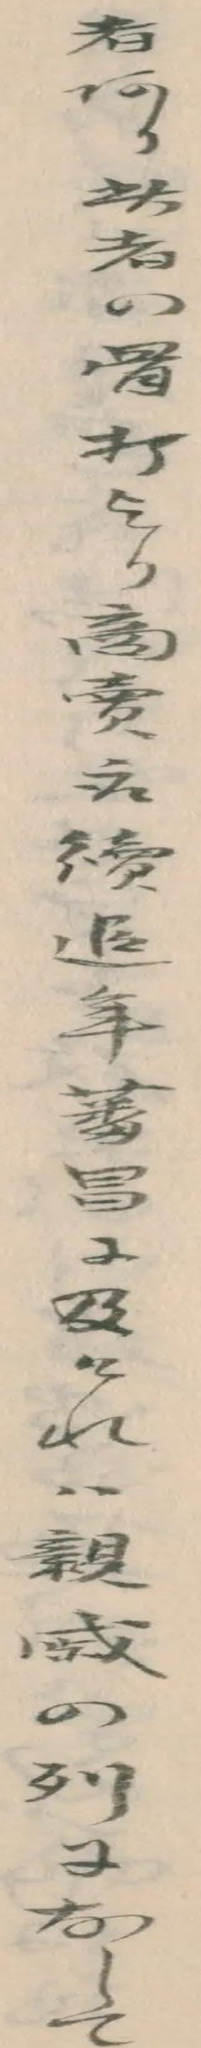者あり此者の骨折より商売取続追年蕃昌に及けれは親戚の列になして
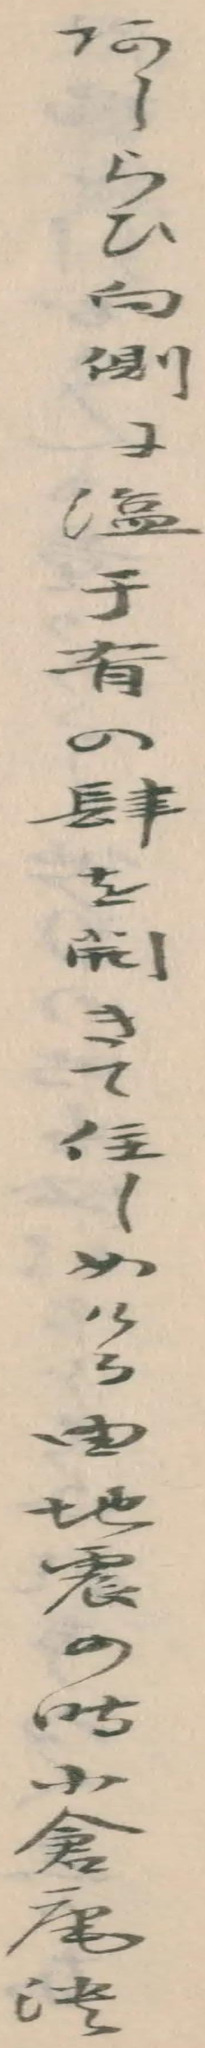あしらひ向側に塩干肴の肆を開きて住しめける由地震の時小倉庵潰
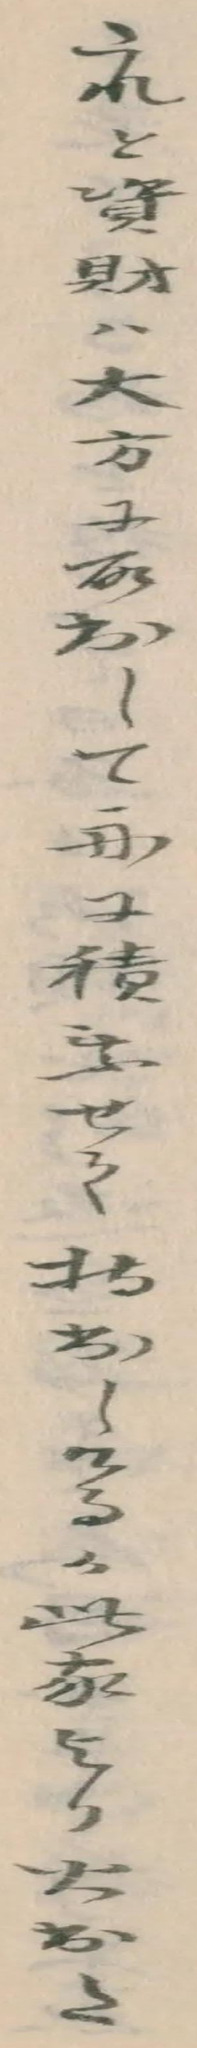たれと資財は大方に取出して舟に積乗せて持出しけるか此家より火出た
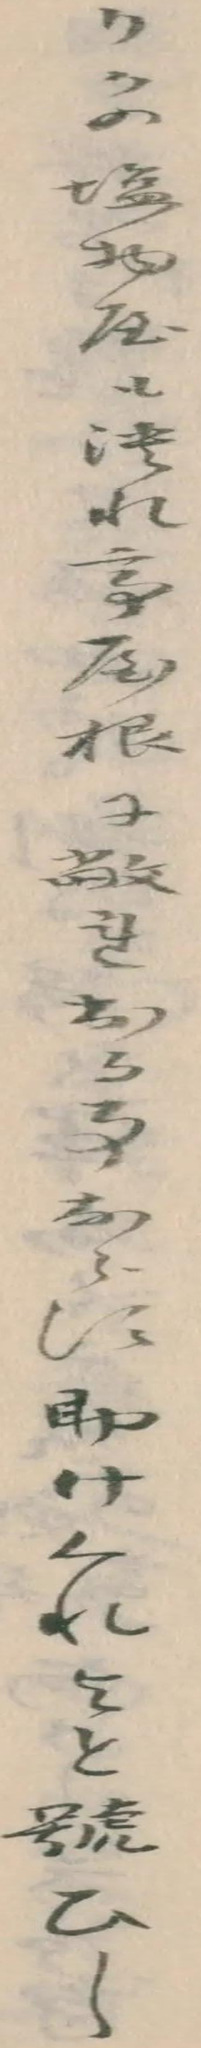りかの塩物屋も潰れて屋根に敝れ出る事ならす助けくれよと号ひし
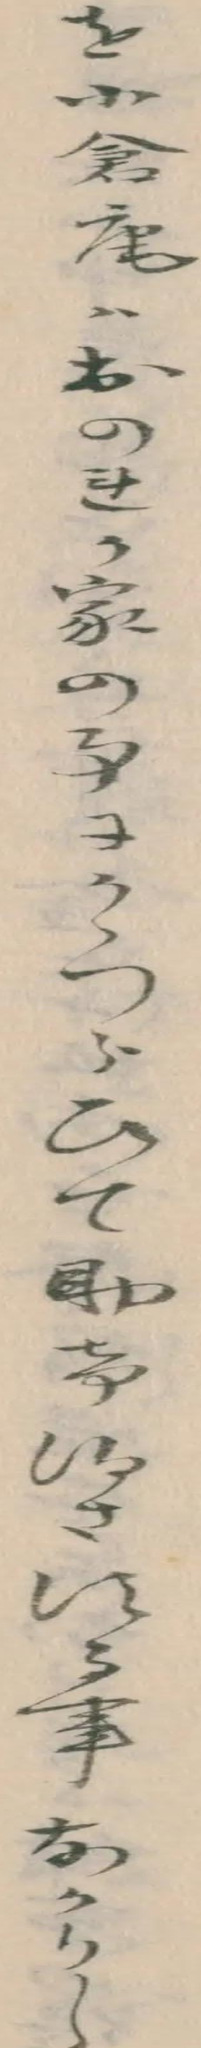を小倉庵はおのれか家の事にかゝつらひて助け得さする事なかりし
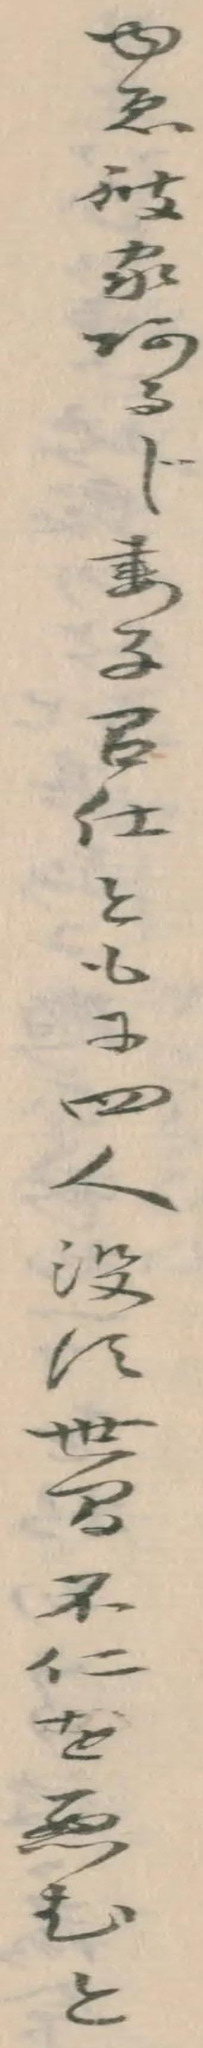ゆゑ彼家あるじ妻子召仕ともに四人没す世間不仁を悪むと
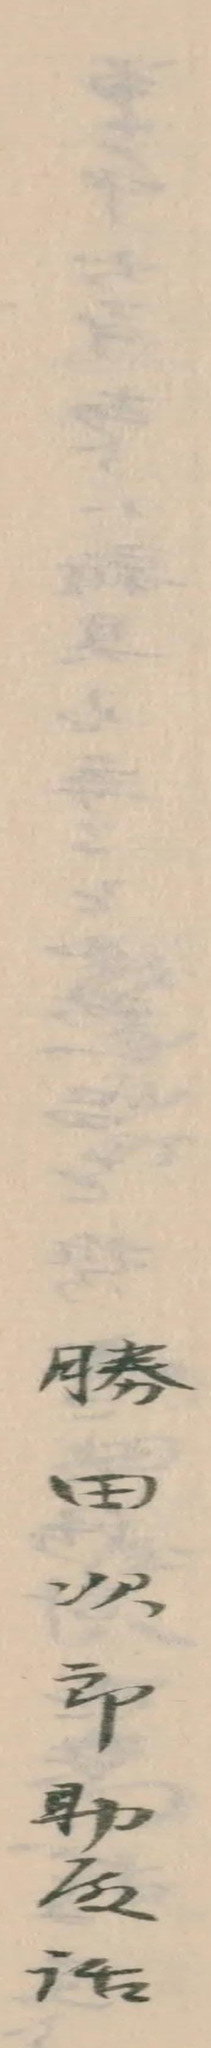勝田次郎助殿話
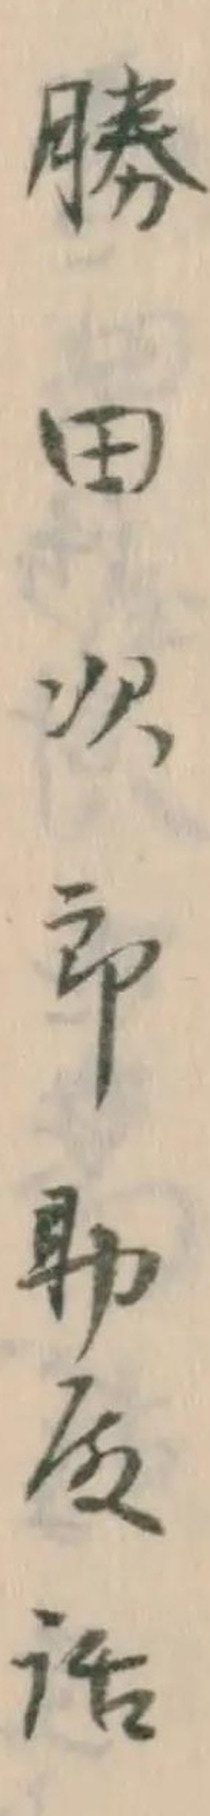勝田次郎助殿話
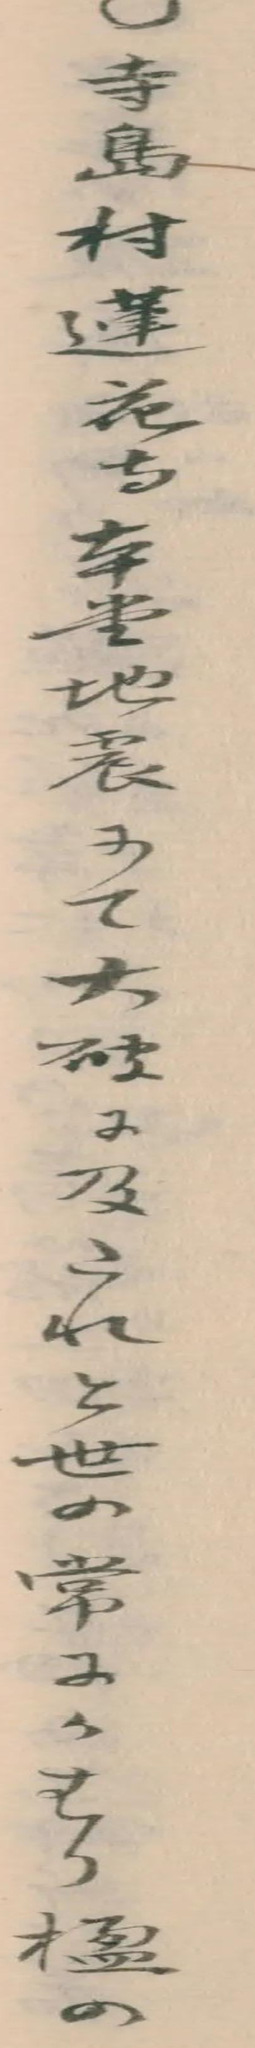〇寺島村蓮花寺本堂地震にて大破に及たれと世の常にかはり楹の
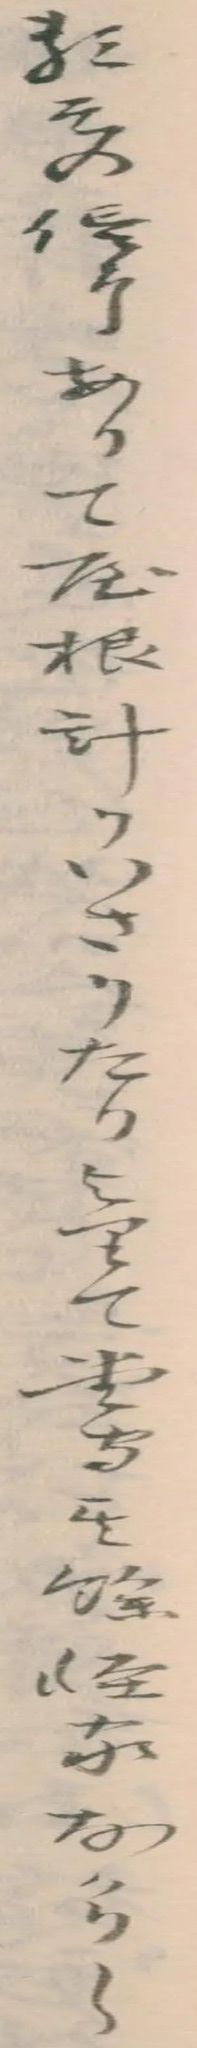類その侭にありて屋根計りいさりたりよりて堂守其余怪家なかりし
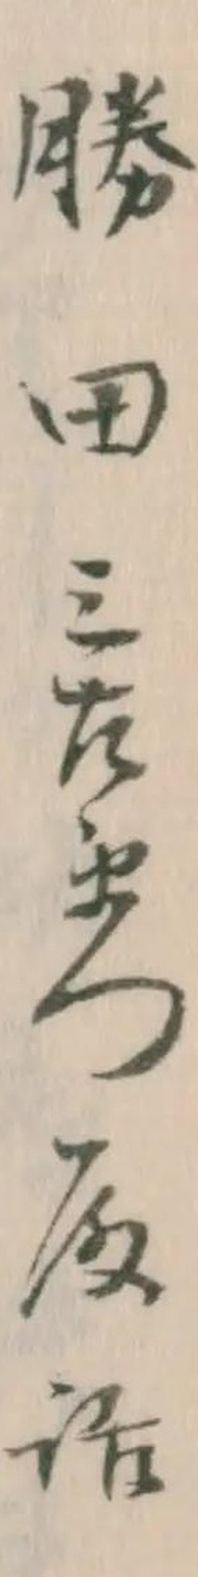勝田三左衛門殿話
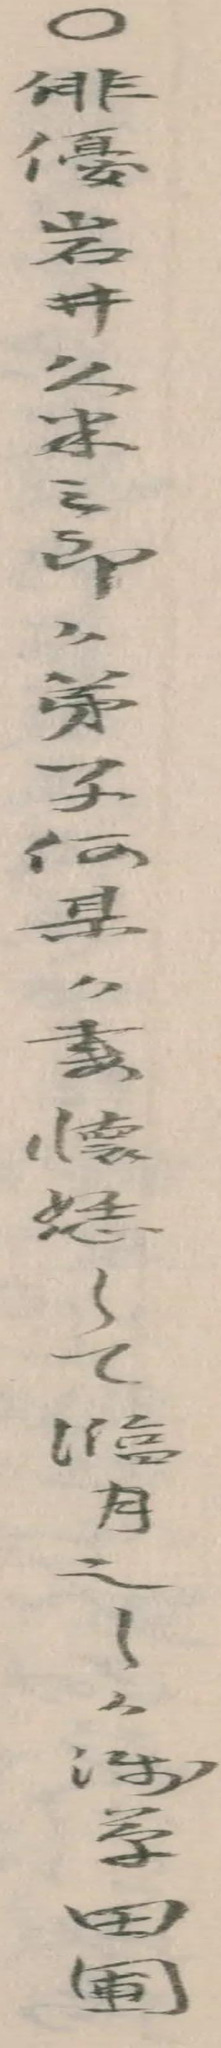〇俳優岩井久米三郎か弟子何某か妻懐妊して臨月也しか浅草田圃
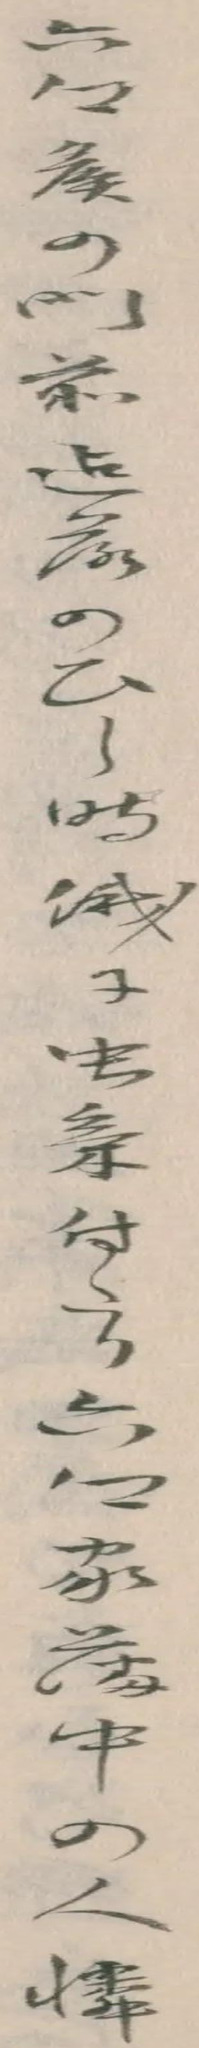六郷侯の門前迄落のひし時俄に虫気付たり六郷家藩中の人憐
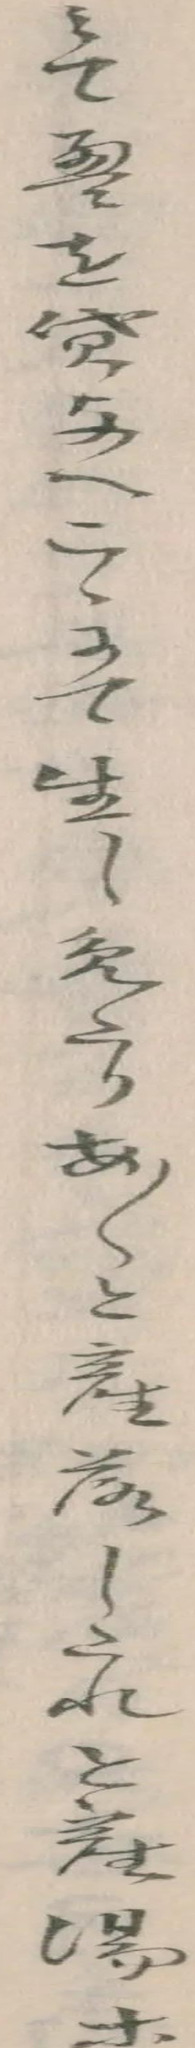みて盈を貸与へこゝにて生しめたり安〳〵と産落したれと産湯等
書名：地災撮要. 巻7-9(地震之部)
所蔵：国立国会図書館 National Diet Library, JAPAN
